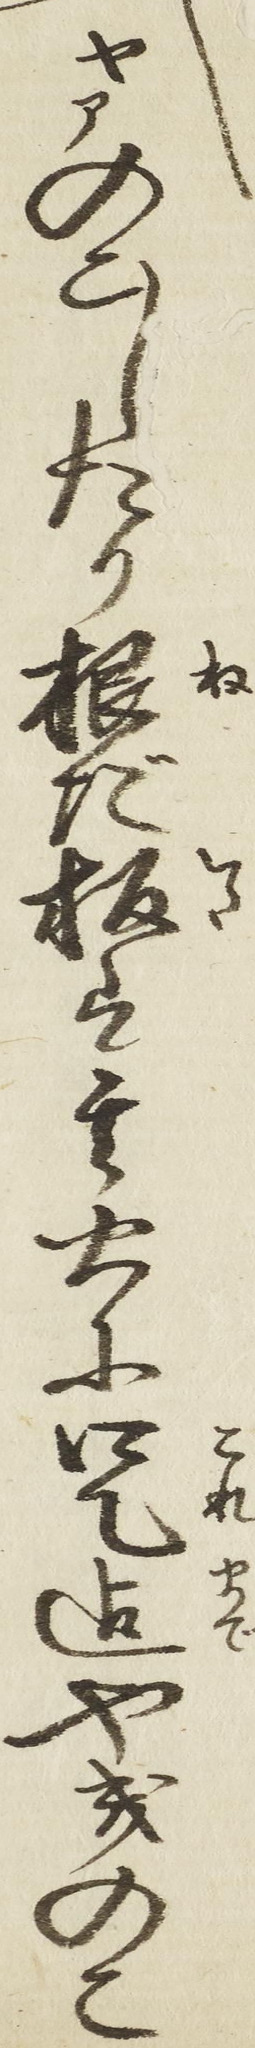〽ヤアのひたり根だ板は其火に是迄やけのこ
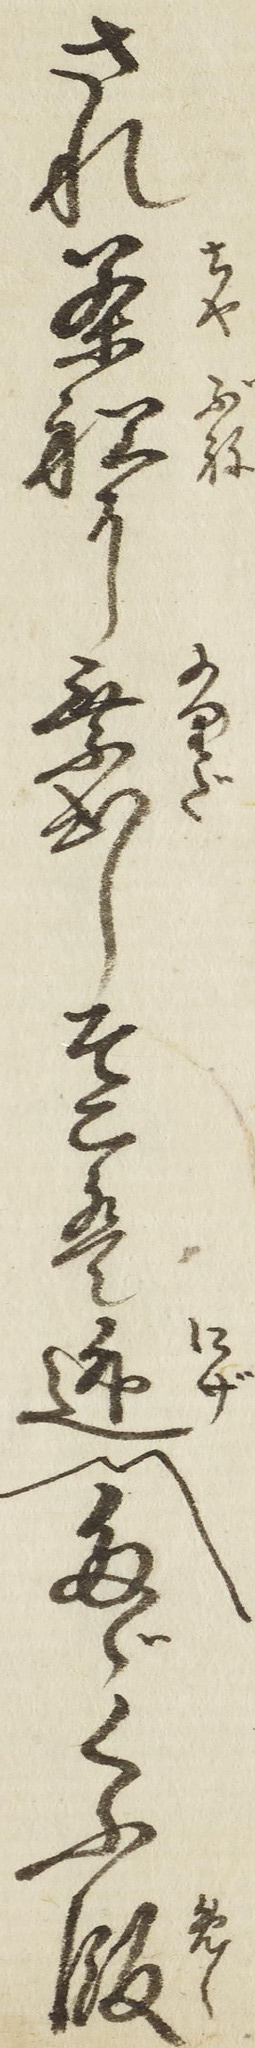され茶船に乗出しそこは逃〽たゞくふ飯
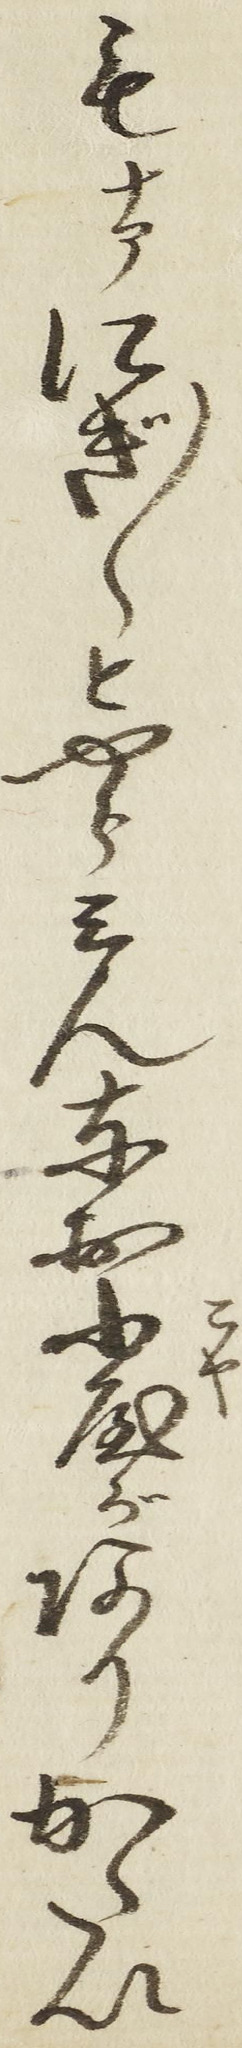もナアにぎ〳〵とやらミんなお小屋がありかたい
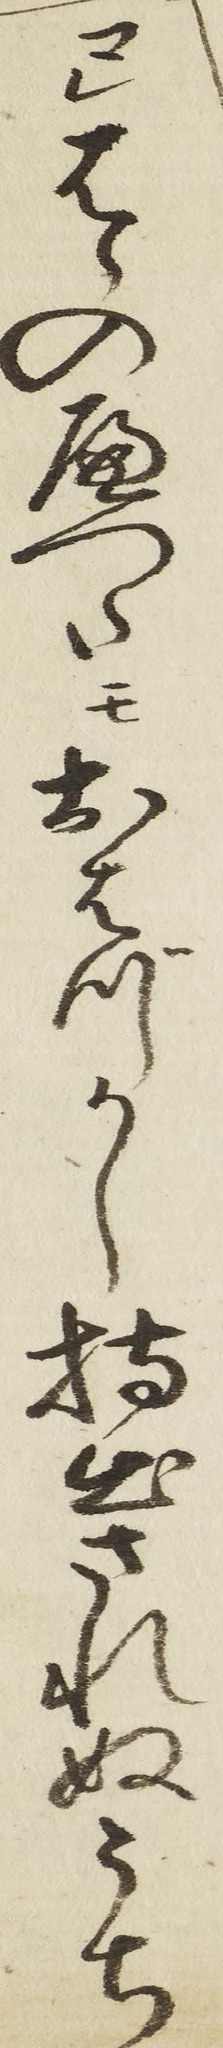〽マㇾはらのへつたモおはずかし持出されぬうち

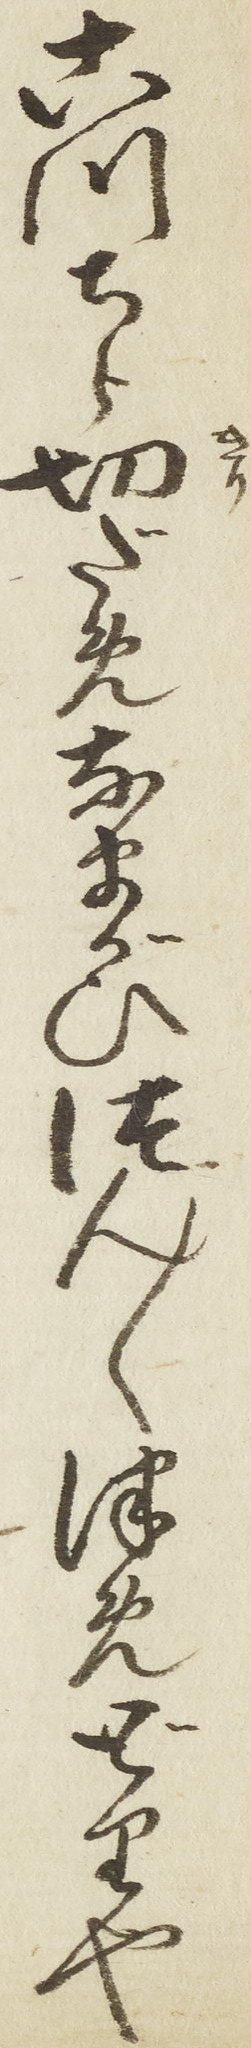こつちら切だめなまがひつん〳〵つめどりや
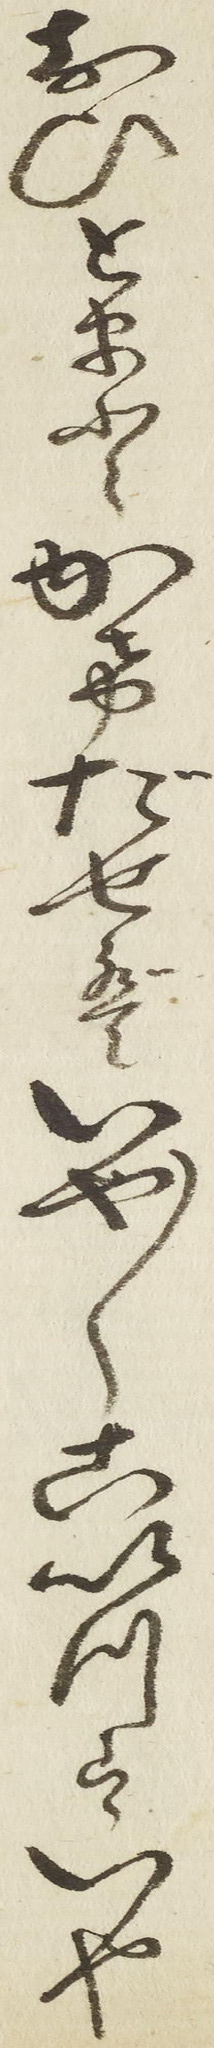おひとまとかけだせばいや〳〵こいつはいや
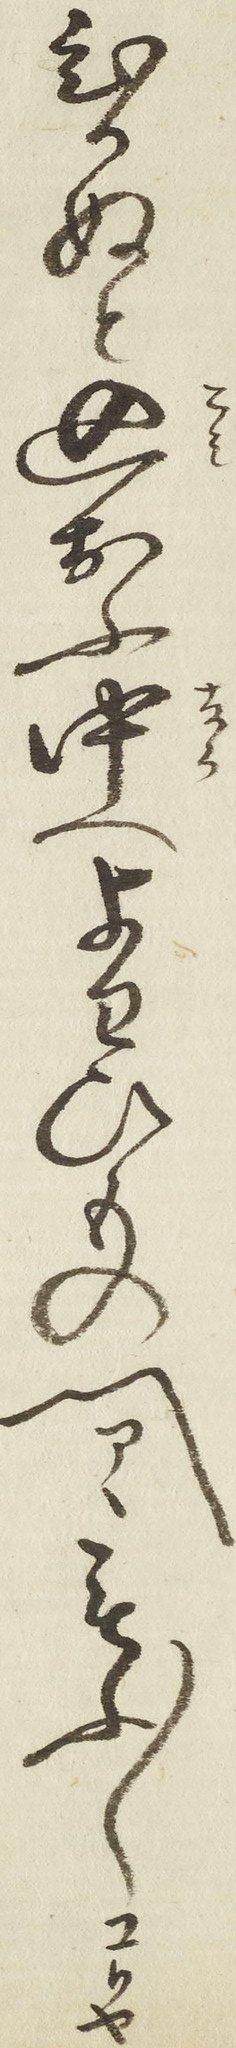ひかぬと込おふ中へよわひもの〽アゝもふ〳〵コリヤ
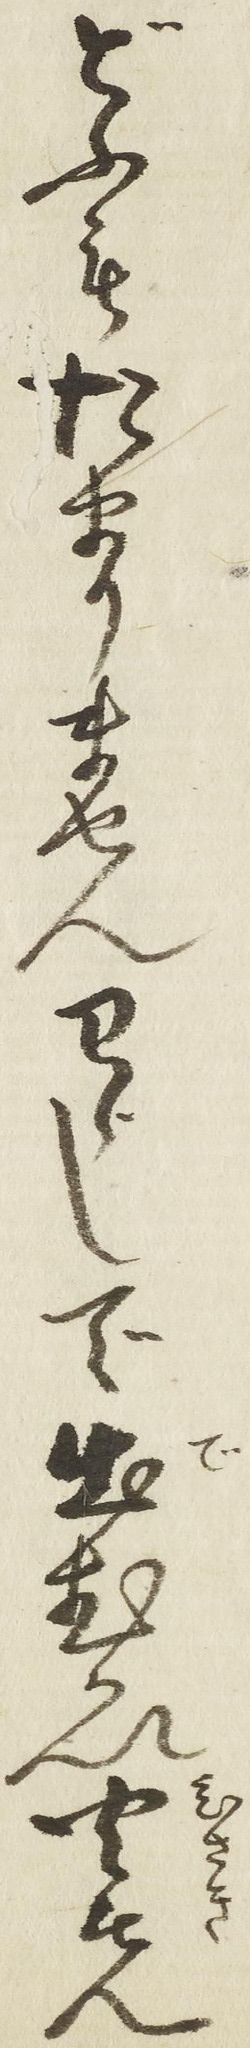どふもたまりませんわらしで出むかい火先
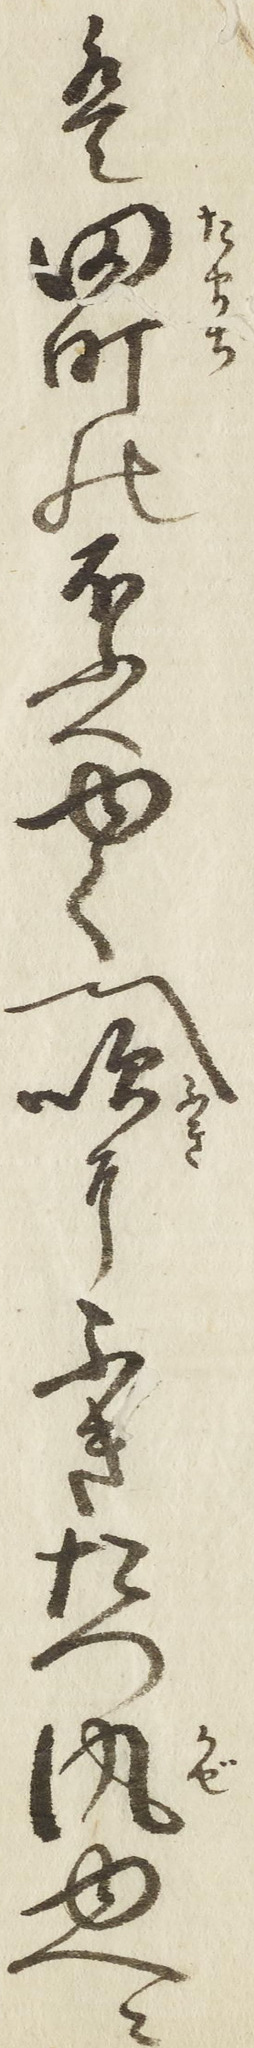は田町のほふへゆく〽吹にふきたつ風ゆへ二
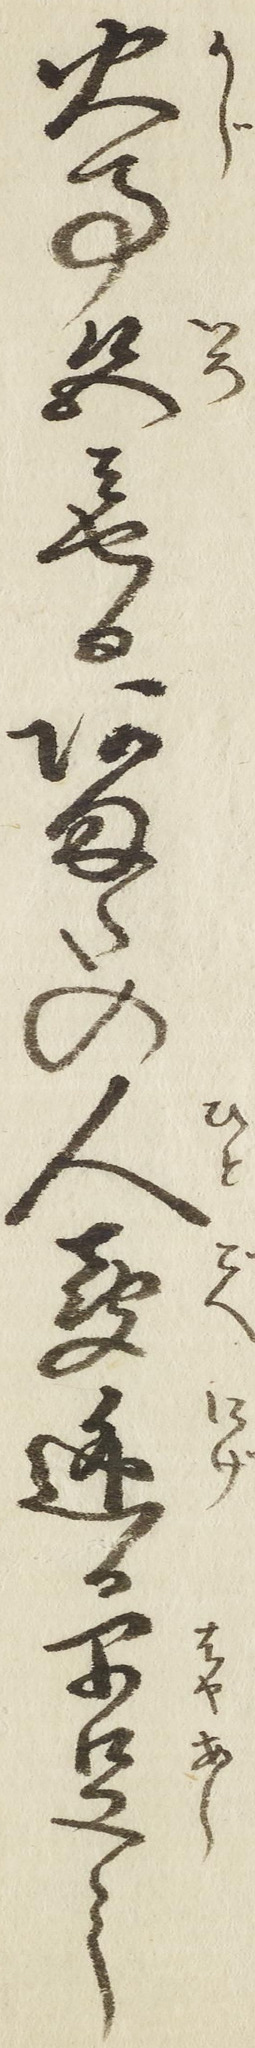火事色ミせるあまたの人声逃る早足之
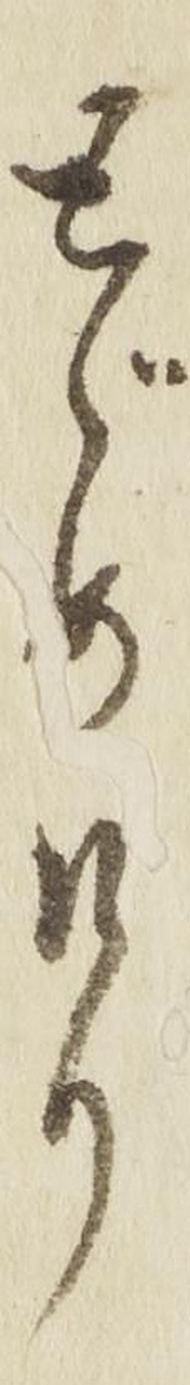とゞめけり
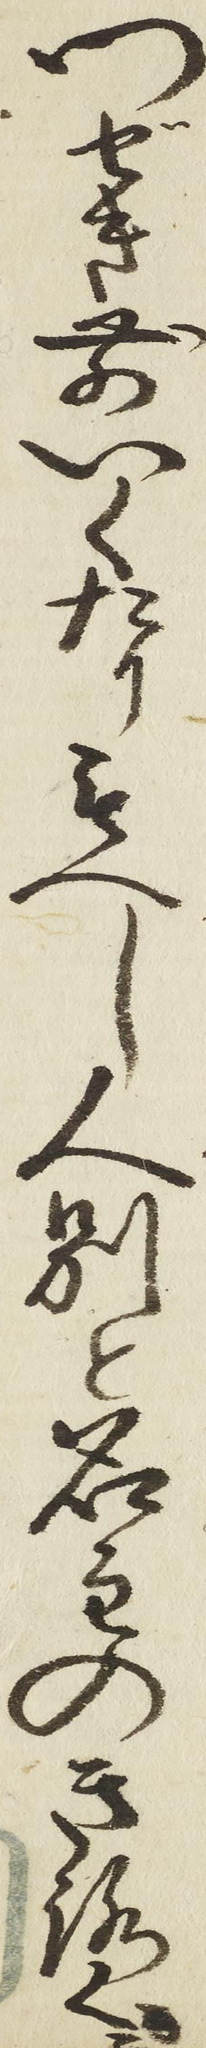門ぜき前いくたりもへし人別と名主のきろく二
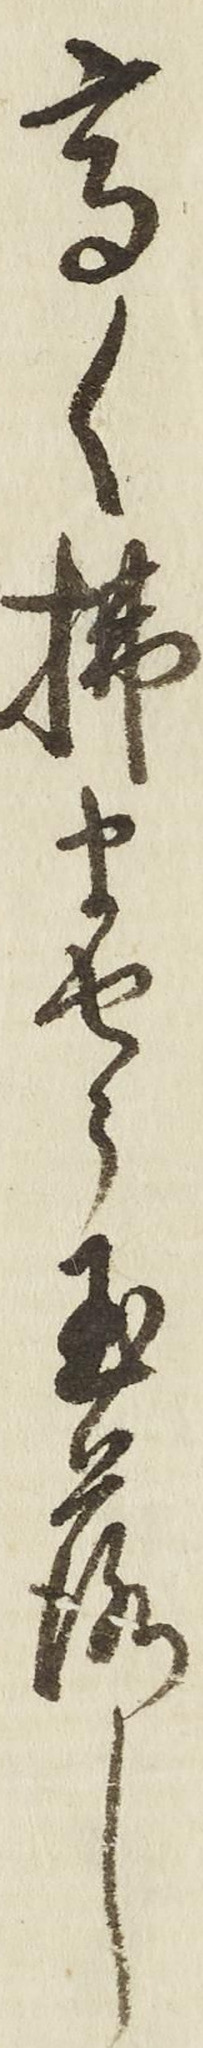高く払ませう玉落し
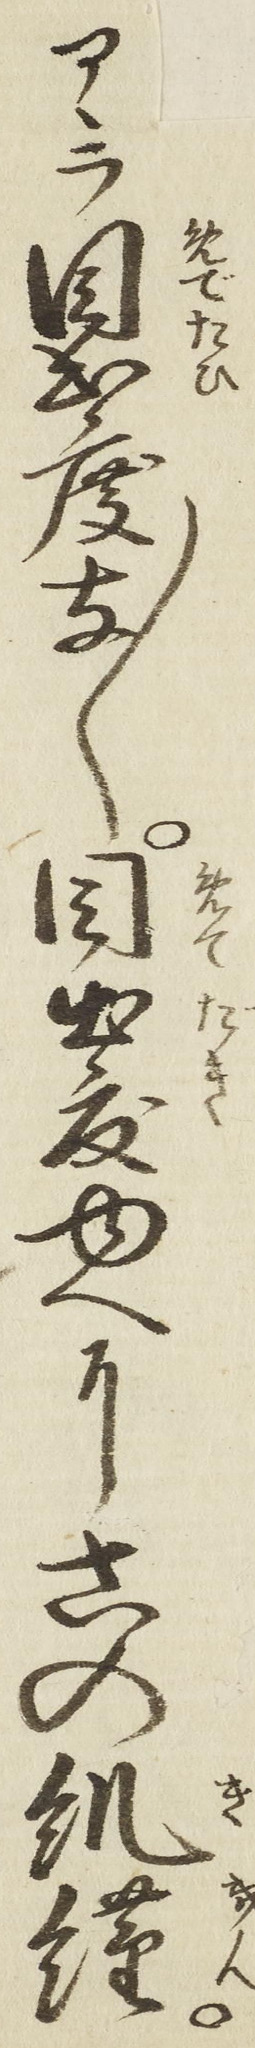アゝラ目出度な〳〵○目出度ゆへにこの飢饉。
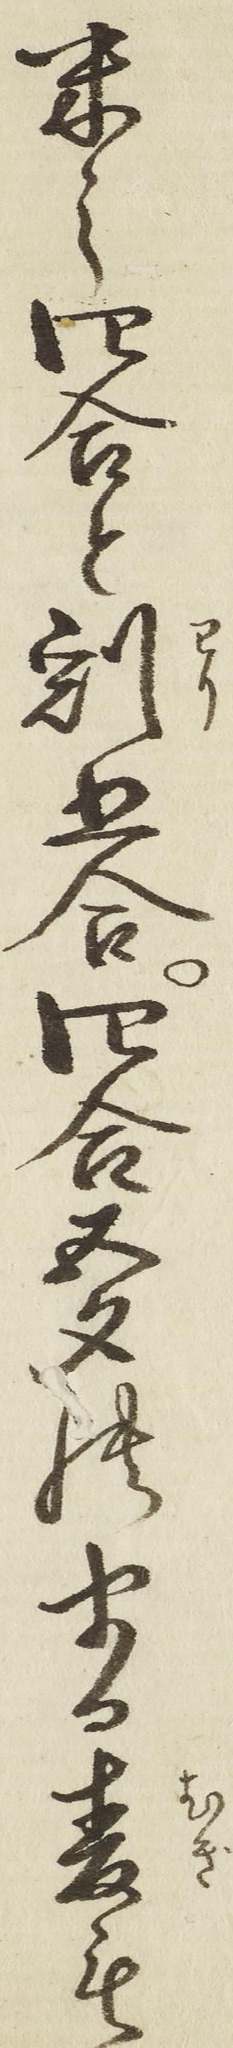米之四合と割五合。四合五勺のまる麦も
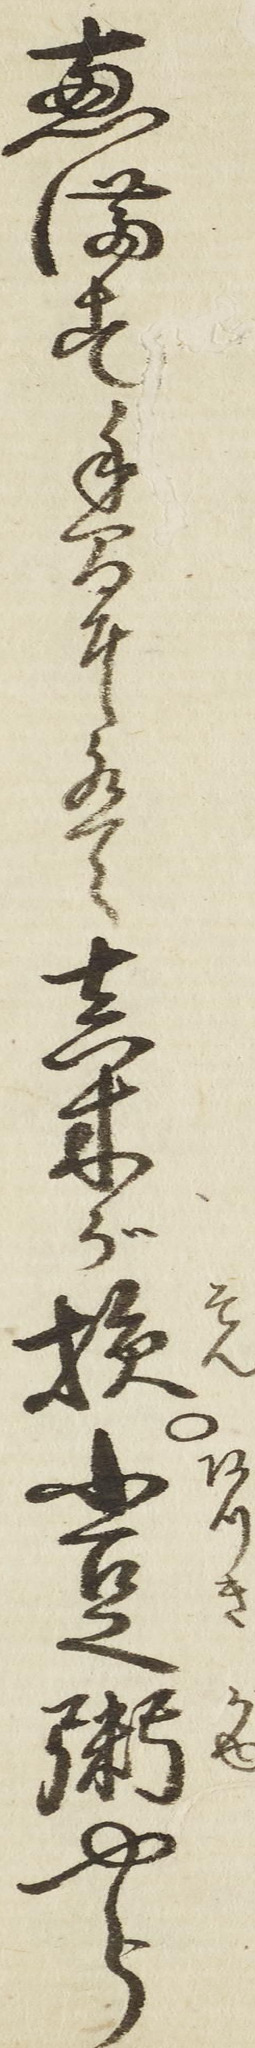恵ます手間にはまきが損。小豆粥やら
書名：天保佐久　滑稽茶利集記
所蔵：東京大学地震研究所図書室 Earthquake Research Institute Library, The University of Tokyo, JAPAN
